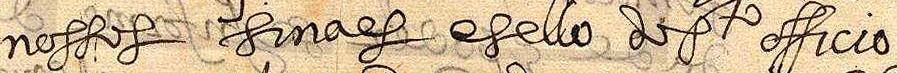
nossos sinaes e sello do sto officio
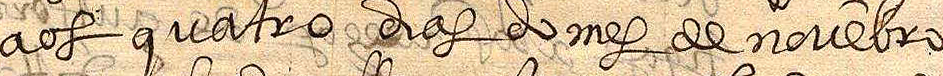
aos quatro dias do mes de nouēbro
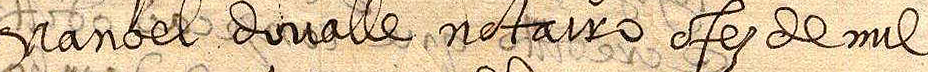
Manoel do ualle notairo o fez de mil
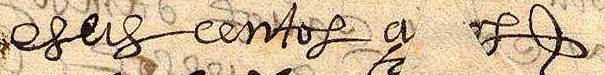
e seiscentos a os
